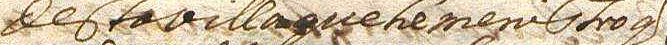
desta villa que he menistro q̄
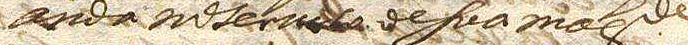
anda no seruico de sua mag.de
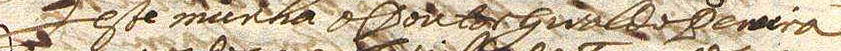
Testemunha o Doutor giraldo Pereira
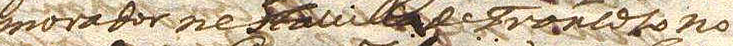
morador nesta uilla de Trancoso no
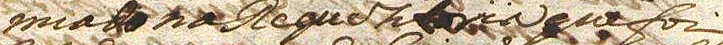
meado na Requezitoria que foi
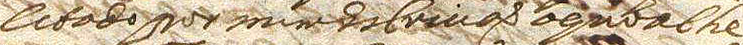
Citado por mim EsCriuaõ o quoal he
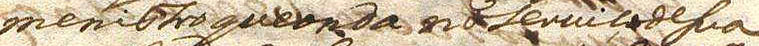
menistro que anda no seruiço de sua
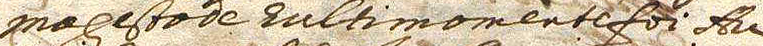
magestade E ultimamente foi Au
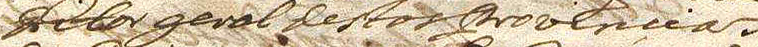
ditor geral destas Provinçias
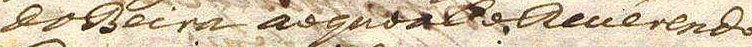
da Beira ao quoal o Reuerendo
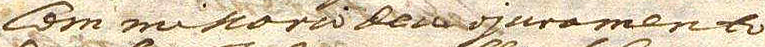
Commissario deu o juramento
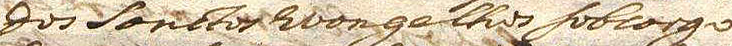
dos Sanctos Evangelhos sob cargo
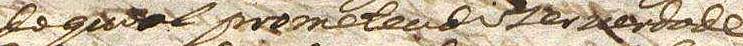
do quoal prometeu dizer uerdade
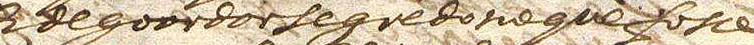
E de goardar segredo no que fosse
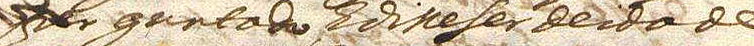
perguntado, E disse ser de idade
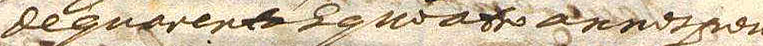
de quarenta E quoatro annos pou
